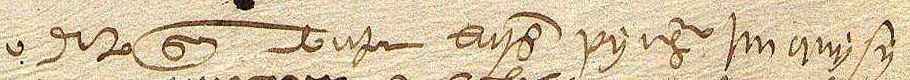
o dito s̄or doutor lujs pynhro Jmquysy
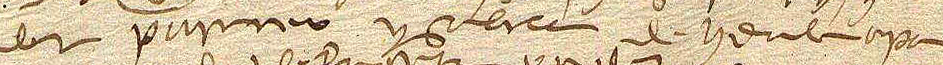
dor pareceo ysabell de ydade a pa
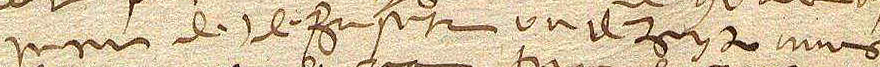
recer de dezasete ou dezoyto anos
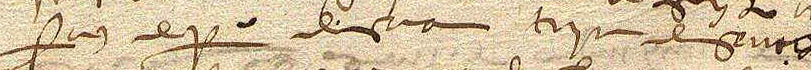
fa de po de saa tera de seuer
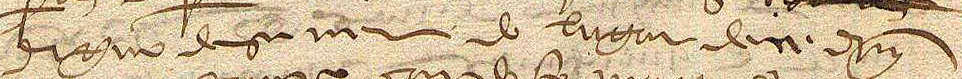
diguo de seuer do lugar de cedrȳ
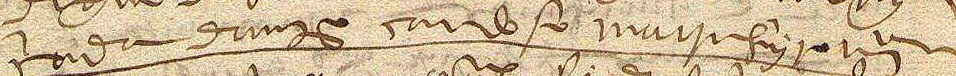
ciada danto cardoso marjnheyro mor
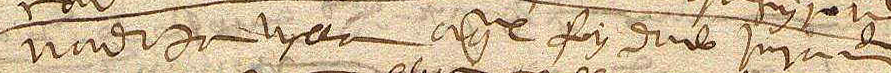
na dita vylla a q̄ll foy dado Juramto
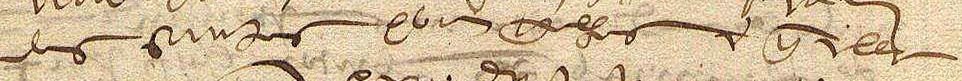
dos santos evagelhos ē q̄ ella
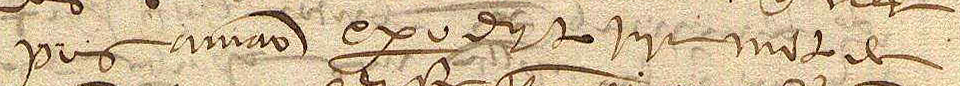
pos a mão e ꝑ o dyto Juramēto de
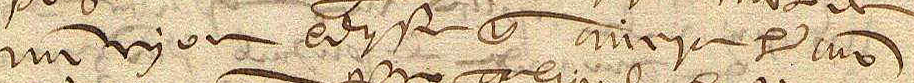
nūcyou e dyse q̄ auera hū anō
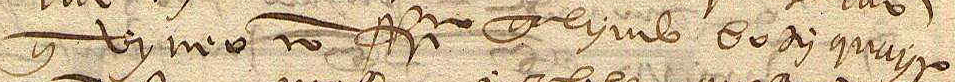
q̄ vyueo c̄o ffrco galyndo botyquayro
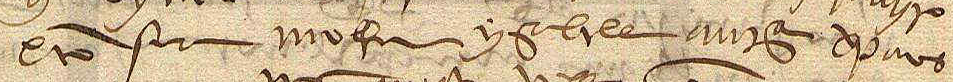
e c̄o sua molher ysabell anta xpãos
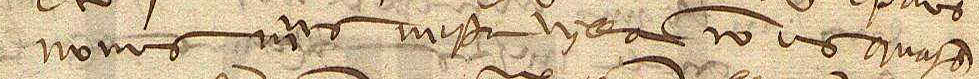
nouos mres nesta vylla c̄o os quajs
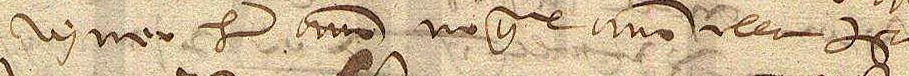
vyueo hū an̄o no q̄l an̄o ella ta
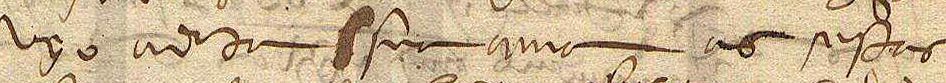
vyo a dita sua ama as sestas
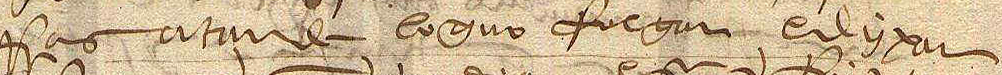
ffras a tarde loguo folgar e deyxar
